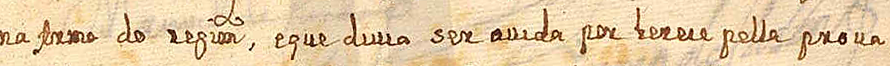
na forma do regimto, e que diuia ser auida por hereie pella proua
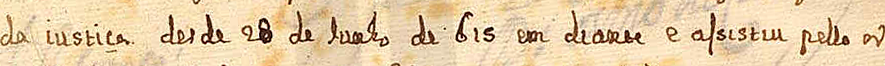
da iustiça desde 28 de Iunho de 615 em diante e asistiu pello or
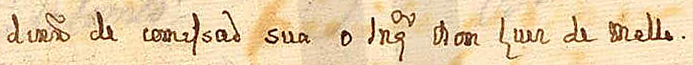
dinro de comissão sua o Inqor Dom Luiz de Mello.
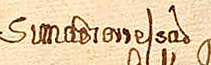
Simaõ torressão
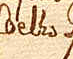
Coelho
